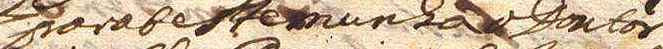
para testemunha o Doutor
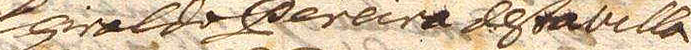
giraldo Pereira desta villa
